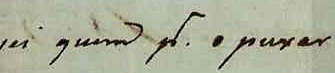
sei quem p.a o puxar
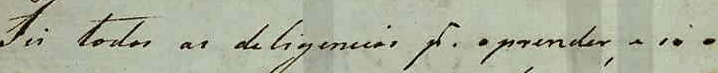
Fis todos as deligencias p.a o prender, e só o
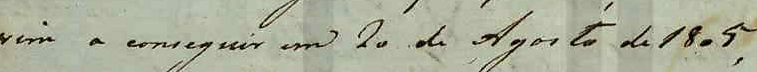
vim a conseguir em 20 de Agosto de 1805,
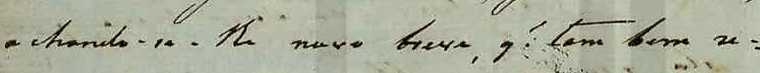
achando-se-lhe novo breve, q̄ tambem re
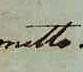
metto.
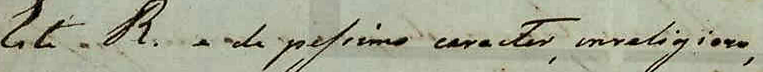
Este R. e de pessimo caracter, inreligiozo,
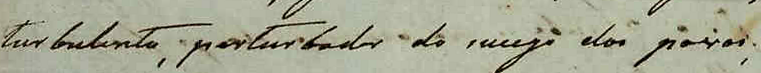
turbulento, perturbador do sucego dos povos,
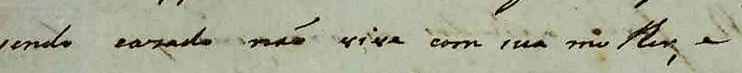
sendo cazado naõ vive com sua mulher, e
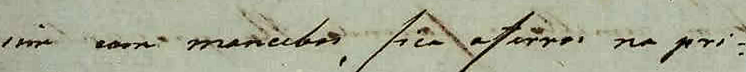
sim com mancebos, fica a ferros na pri
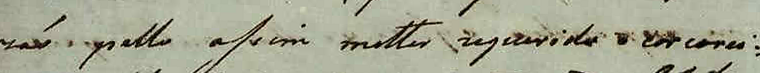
zaõ pello assim metter requerido o carcerei
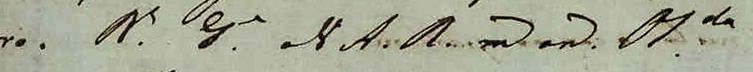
ro. D.s G.e a V A. R. m̄ an̄. Ol.da
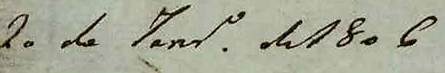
20 de Ianr.o de 1806
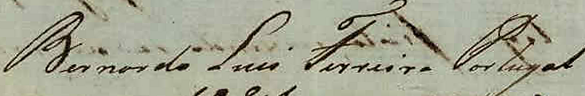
Bernardo Luis Ferreira Portugal
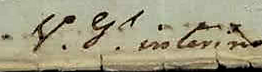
V. G.l interino
